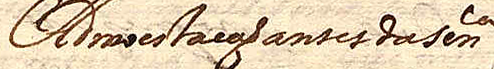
Admoestacaõ antes da senca
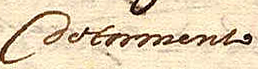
do tormento
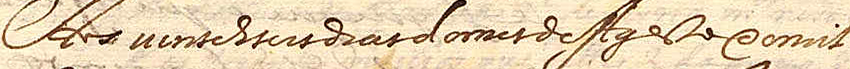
Aos uinte E seis dias do mes de Agosto de mil
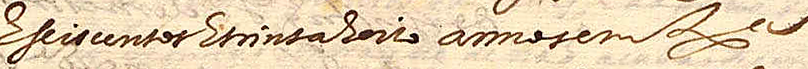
E seiscentos E trinta E oito annos em Lxa
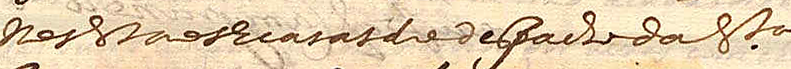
nos Estaos E casas do despacho da s.ta
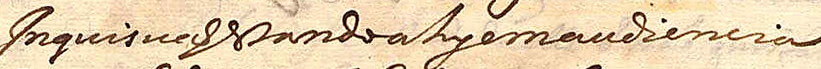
Jnquisicaõ estando ahy em audencia
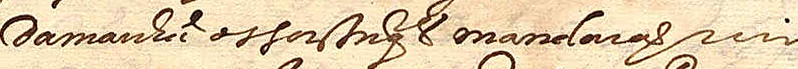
da manhā os sors Inqres mandaraõ uir
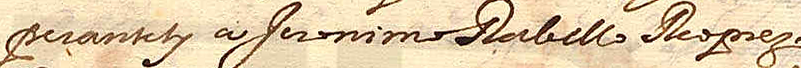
perante sy a Jeronimo Rabello Reo prezo
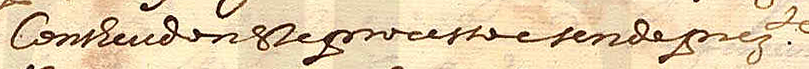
Contheudo neste processo e sendo prez.te
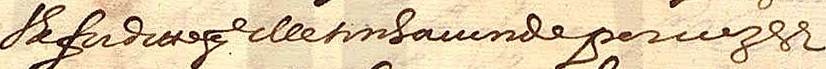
lhe foi ditto q̄ elle tinha uindo por uezes
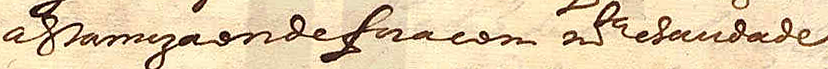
a esta meza onde fora com mta charidade
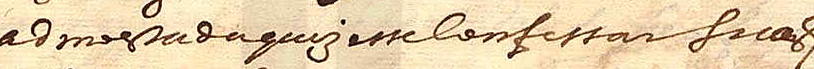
admoestado quizesse confessar suas
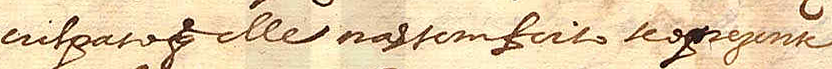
culpas o q̄ elle naõ tem feito te o prezente
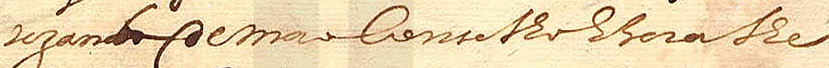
vzando de mao Conselho E hora lhe
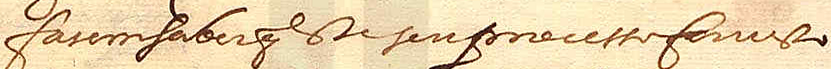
fasem saber q̄ este seu processo foi uisto
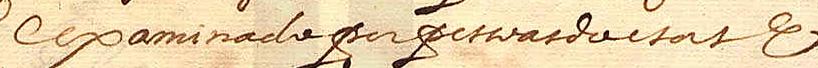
e examinado por pessoas doctas E
